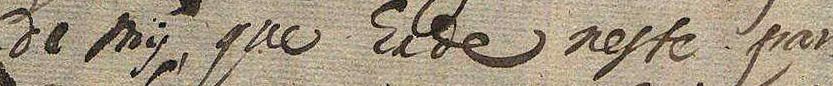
de my que hade neste par
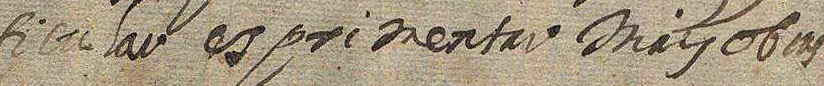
ticular esprimentar mais obras
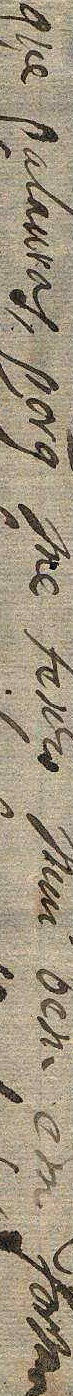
que palauras, porq̄ me tenho mui bem emforma
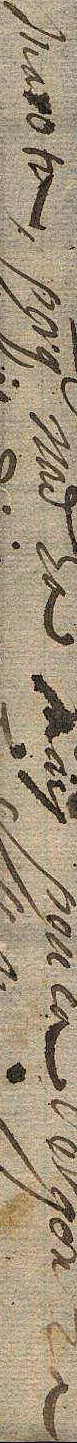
marota, porq̄ naõ ha mais pouca vergonha
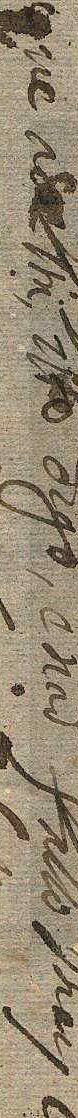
que a de vma, isto digo, e naõ fallo mais
